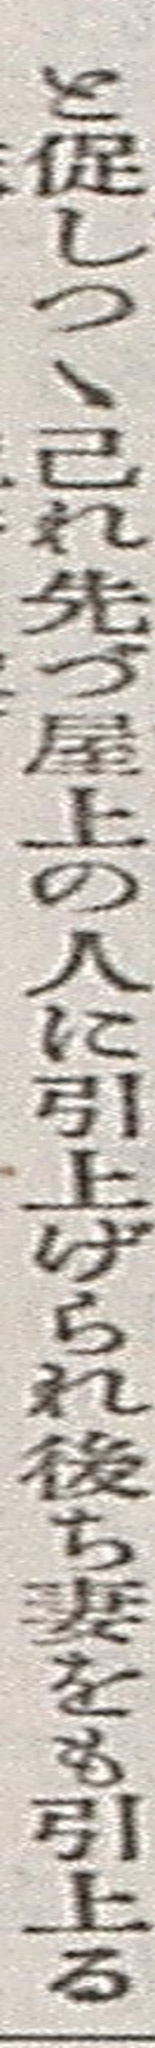と促しつゝ己れ先づ屋上の人に引上げられ後ち妻をも引上る
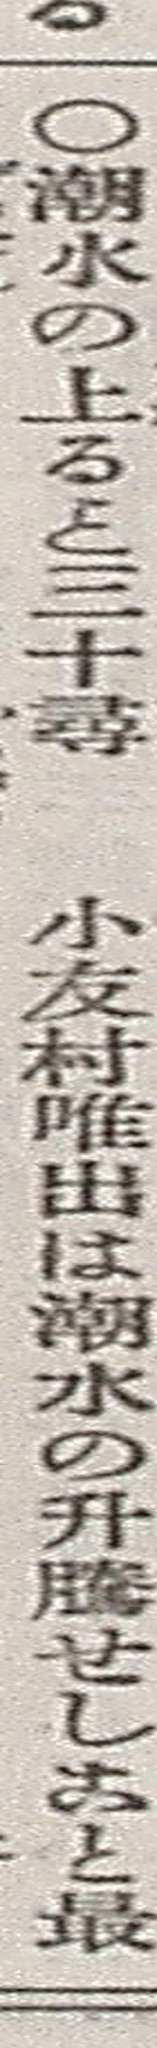○潮水の上ること三十尋小友村唯出は潮水の昇騰せしこと最
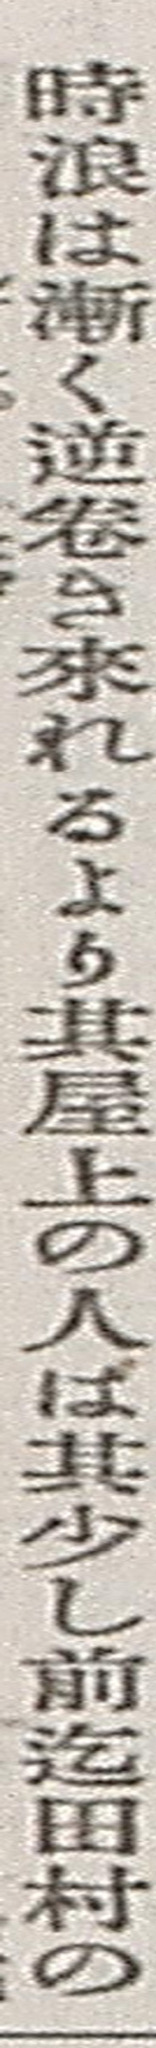時浪は漸く逆巻き来れるより其屋上の人は其少し前迄田村の
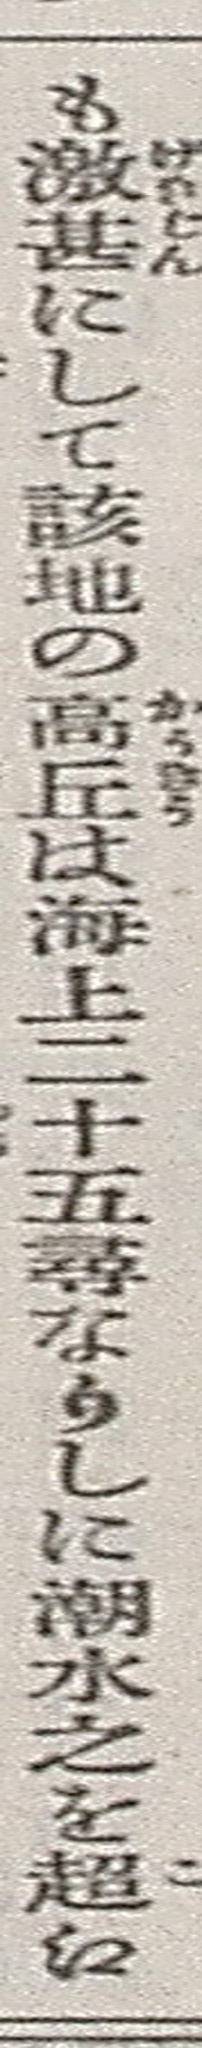も激甚にして該地の高丘は海上二十五尋なりしに潮水之を超え
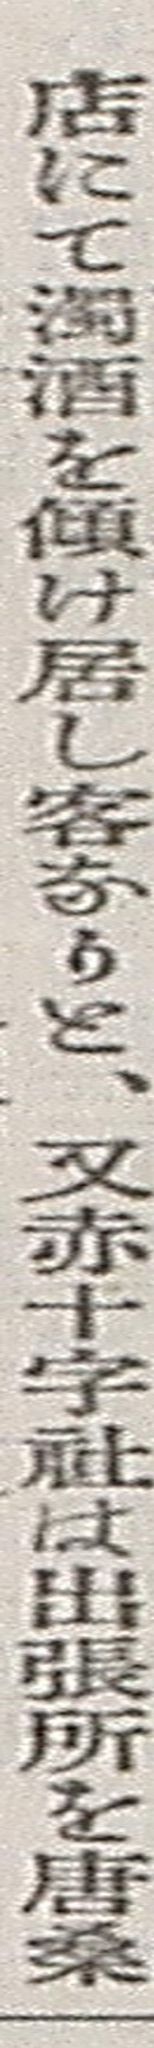店にて濁酒を傾け居し客なりと、又赤十字社は出張所を唐桑
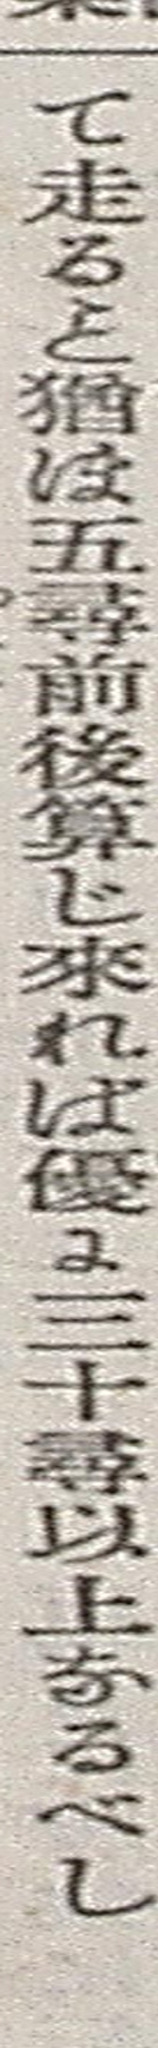て走ること猶ほ五尋前後算じ来れば優に三十尋以上なるべし
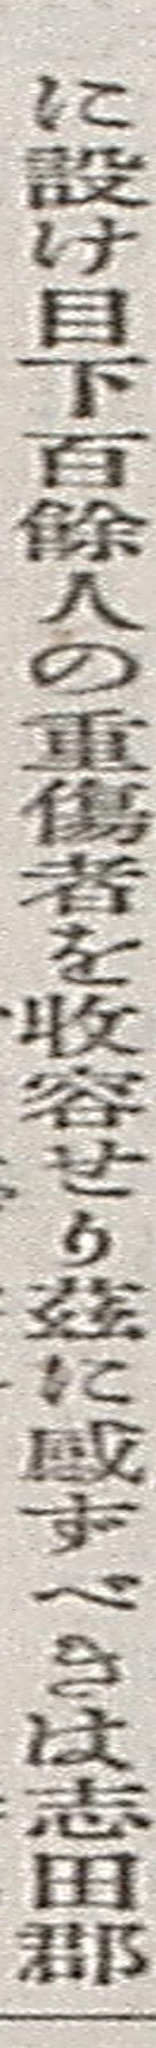に設け目下百余人の重傷者を収容せり茲に感ずべきは志田郡
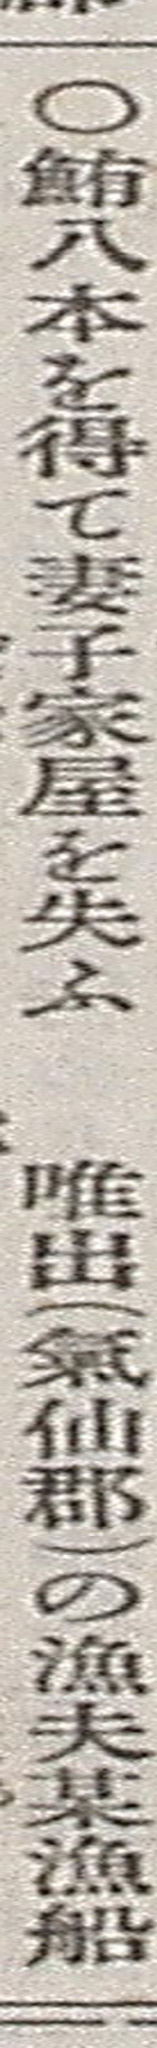○鮪八本を得て妻子家屋を失ふ唯出の漁夫某漁船
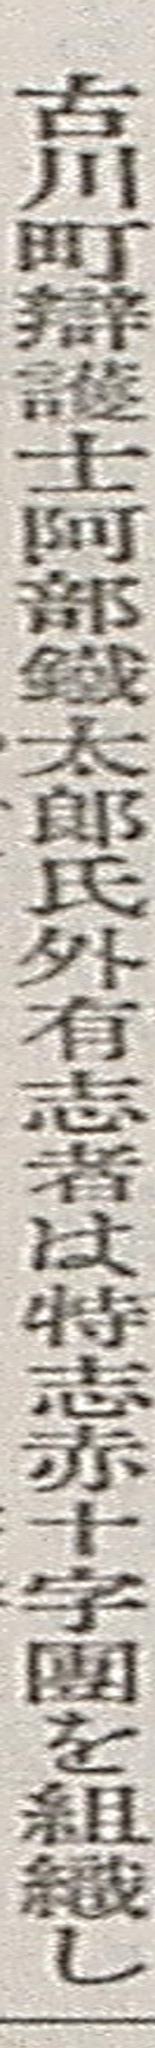古川町弁護士阿部鉄太郎氏外有志者は特志赤十字団を組織し
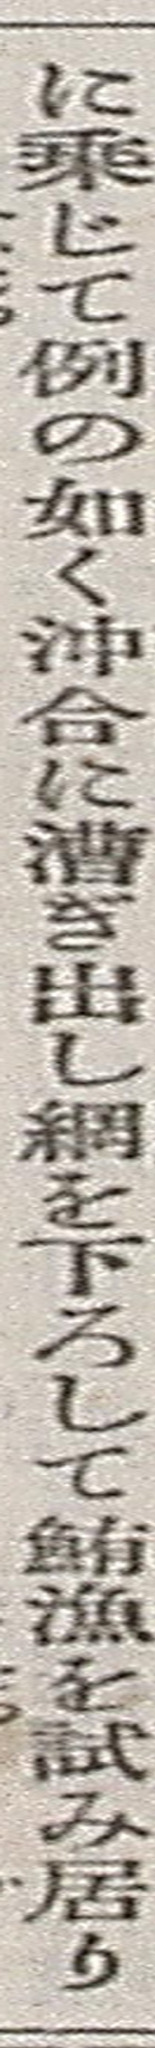に乗じて例の如く沖合に漕ぎ出し網を下ろして鮪漁を試み居り
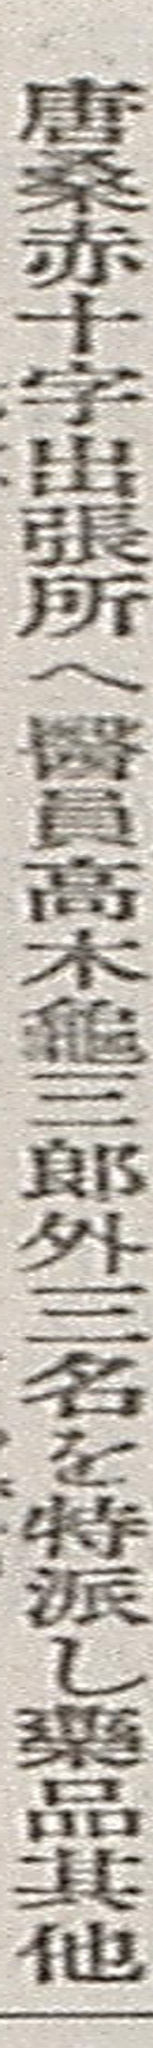唐桑赤十字出張所へ医員高木亀三郎外三名を特派し薬品其他
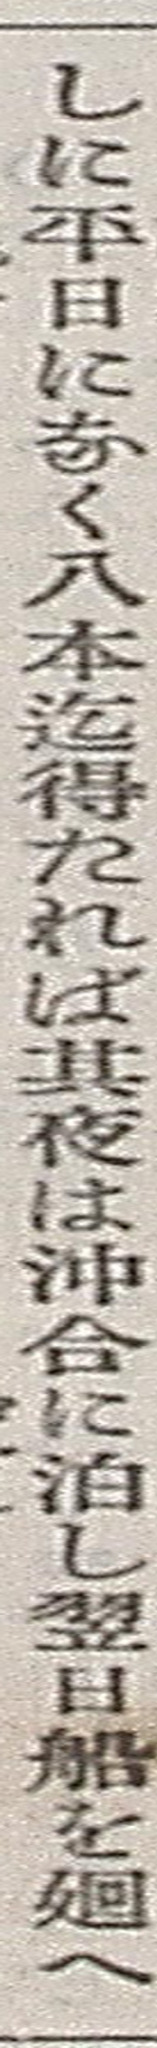しに平日になく八本迄得たれば其夜は沖合に泊し翌日船を廻へ
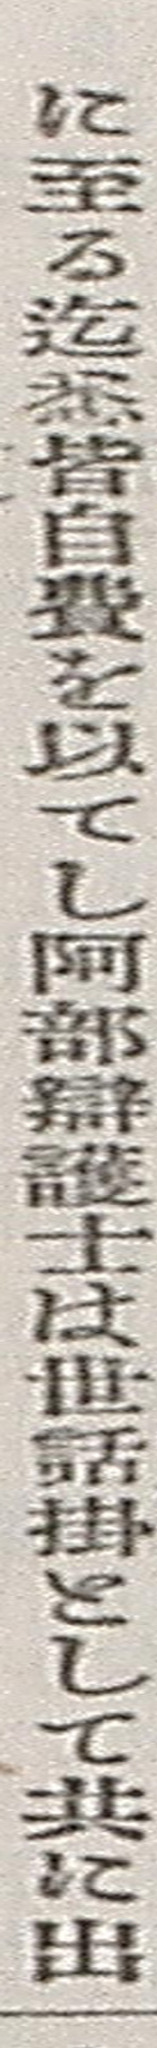に至る迄悉皆自費を以てし阿部弁護士は世話掛として共に出
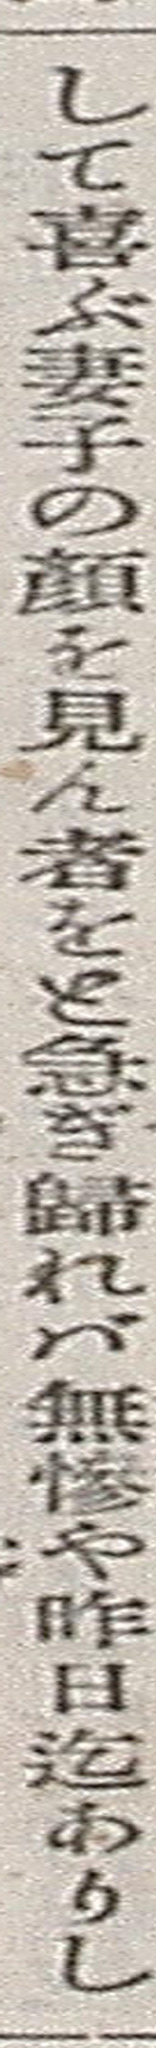して喜ぶ妻子の顔を見ん者をと急ぎ帰れば無惨や昨日迄ありし
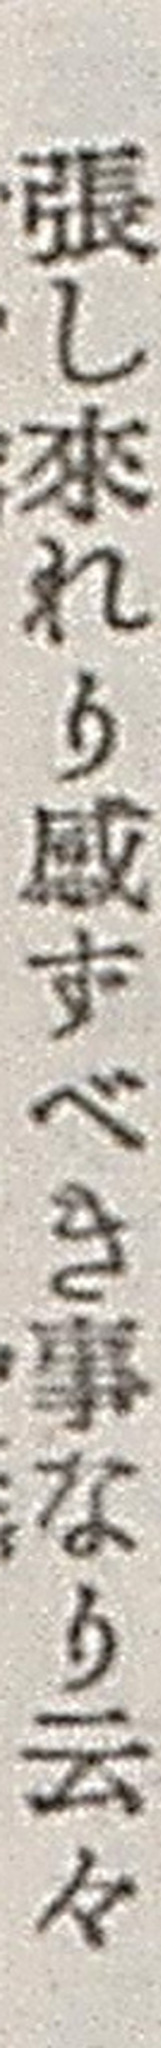張し来れり感ずべき事なり云々
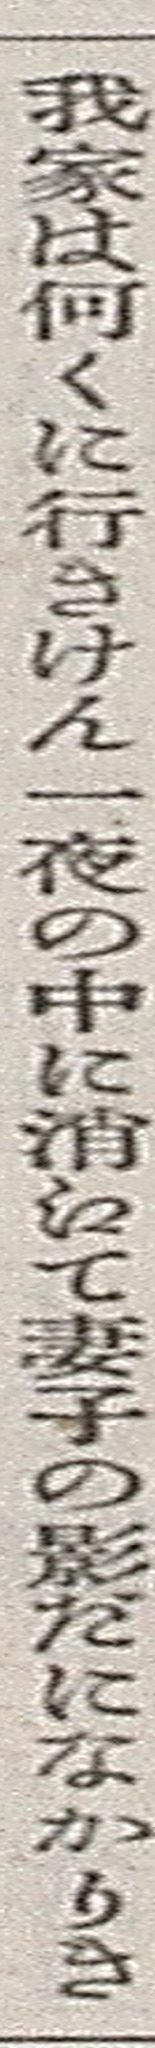我家は何くに行きけん一夜の中に消えて妻子の影だになかりき
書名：風俗畫報臨時増刊第百十九號　大海嘯被害録（中）
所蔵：東京大学地震研究所図書室 Earthquake Research Institute Library, The University of Tokyo, JAPAN
